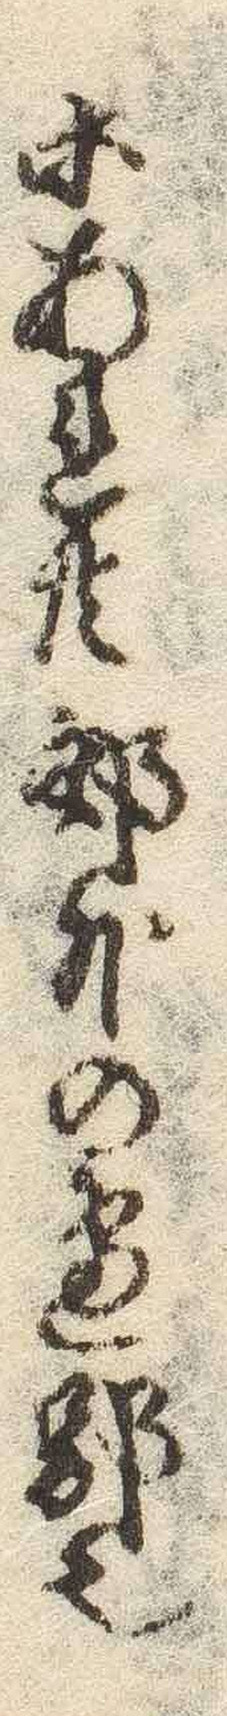等あれ共郊外の辺鄙也
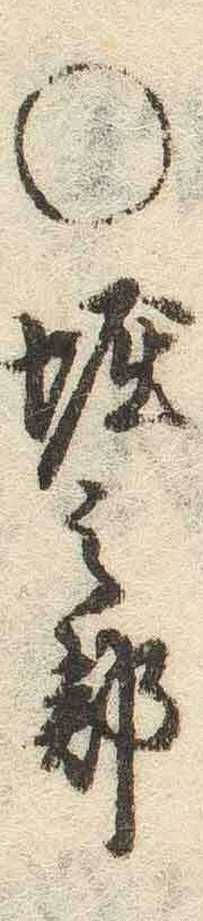○堀之部

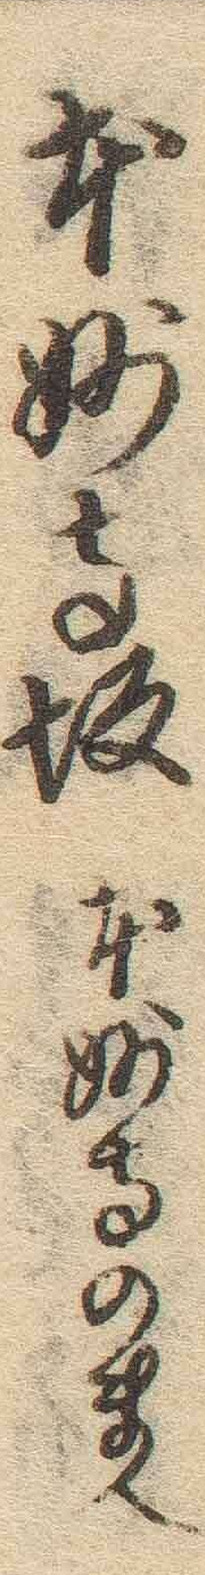本妙寺坂本妙寺のまへ
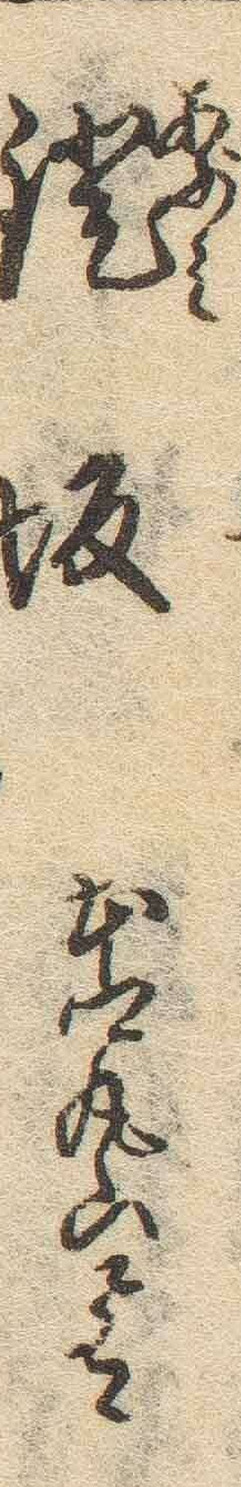鐙坂本郷丸山に有

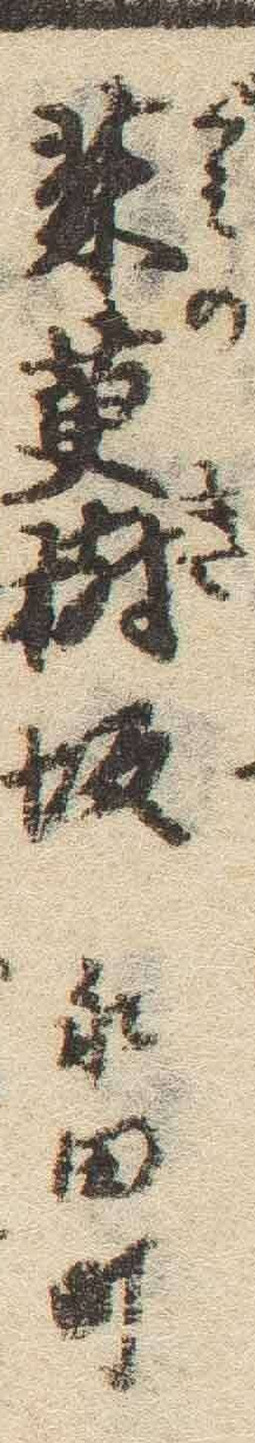茱萸樹坂永田町

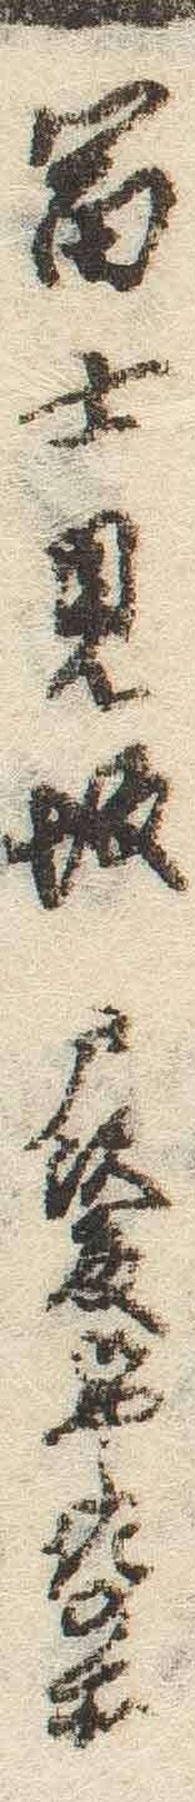富士見坂戸沢殿御やしきの所

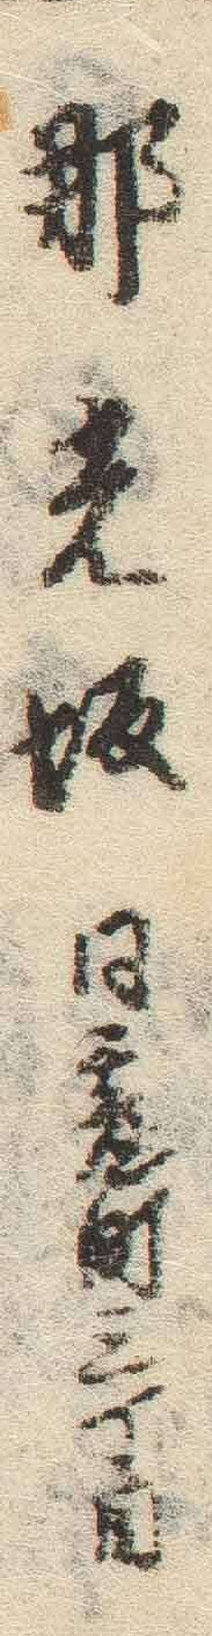那光坂同台町三丁目
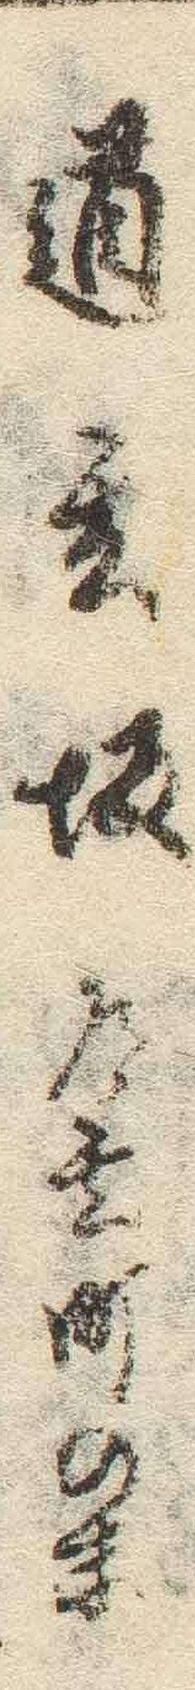道玄坂道玄町の末
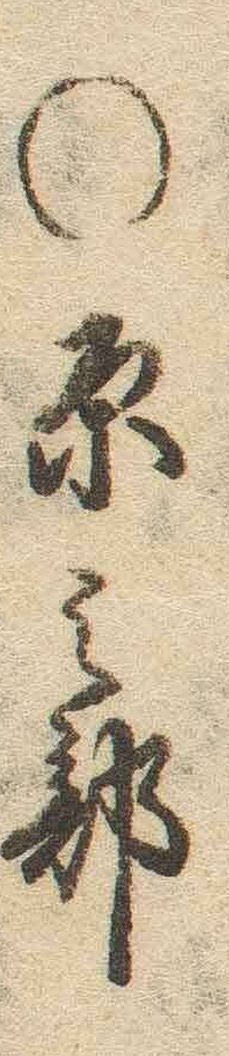○原之部
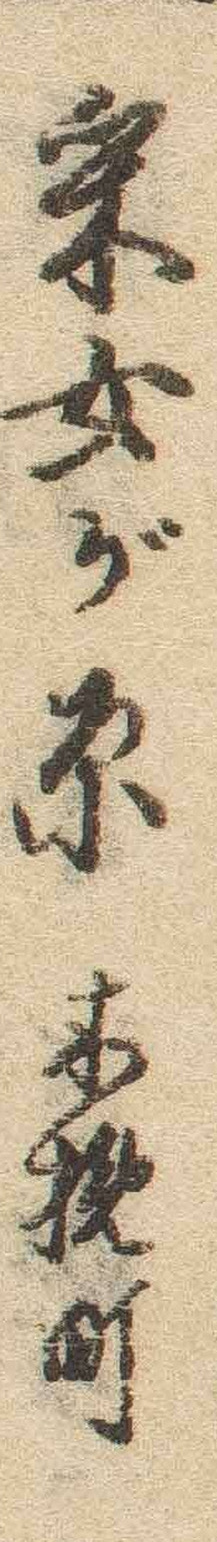采女が原木挽町

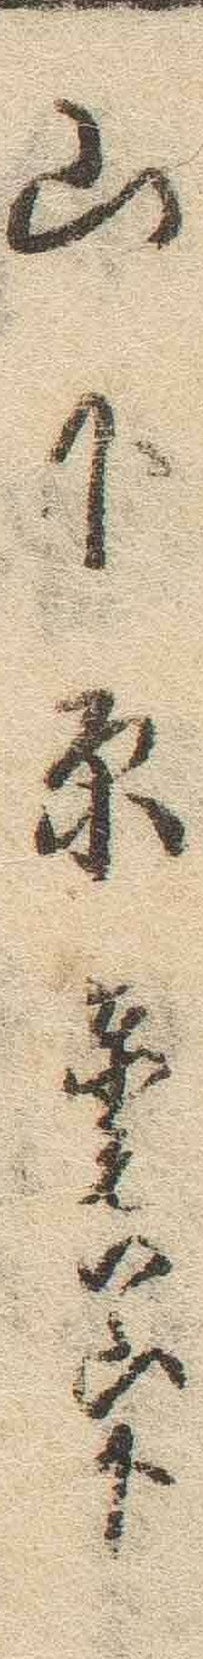山下原東えい山下
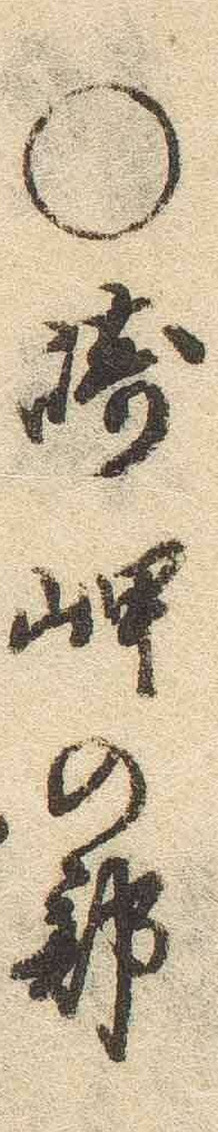○崎岬の部
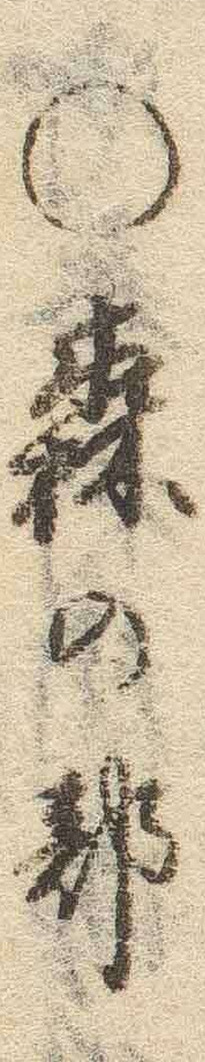○森の部
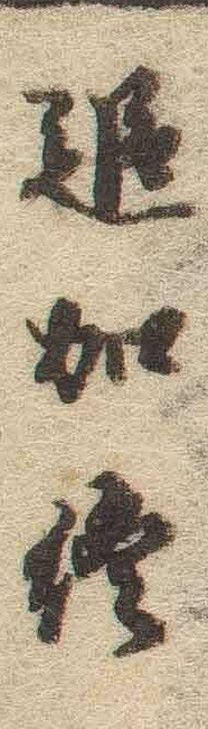追加終

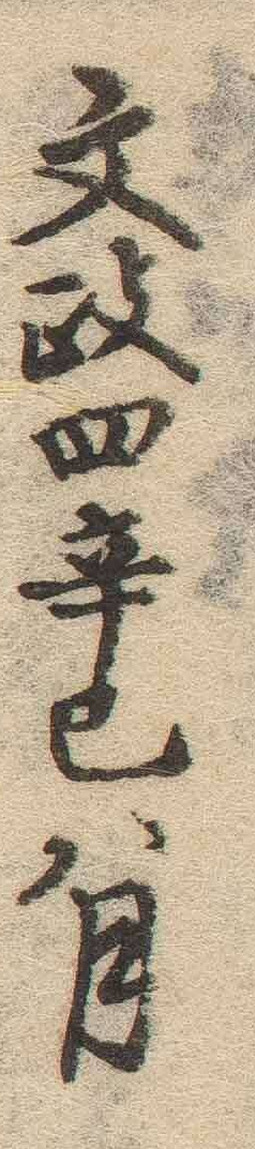文政四辛巳八月
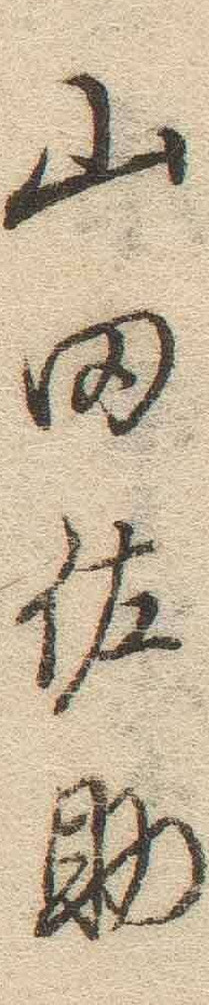山田佐助
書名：江戸町独案内
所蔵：東京学芸大学附属図書館 国文学研究資料館
